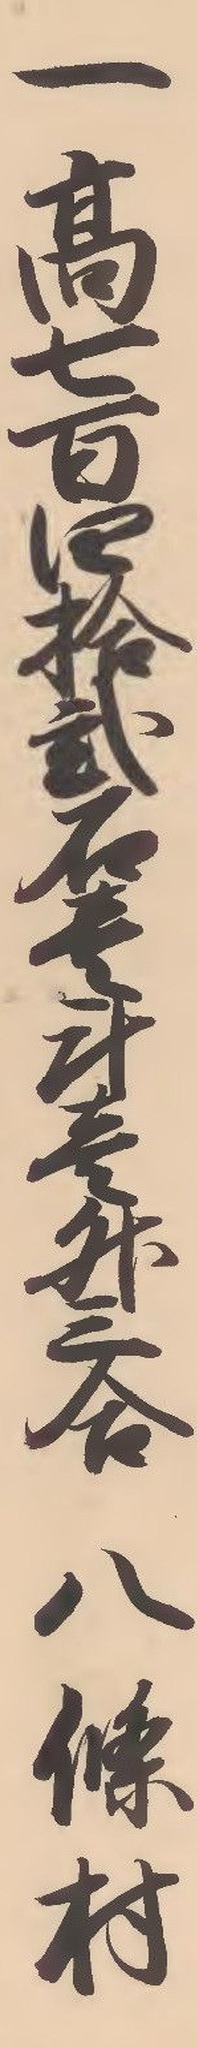一高七百四拾弐石壱斗壱升三合八条村
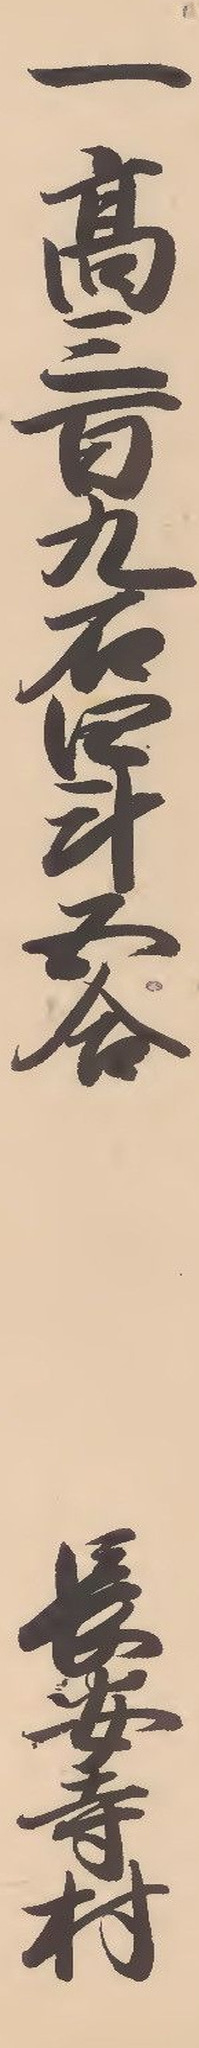一高三百九石四斗五合長安寺村
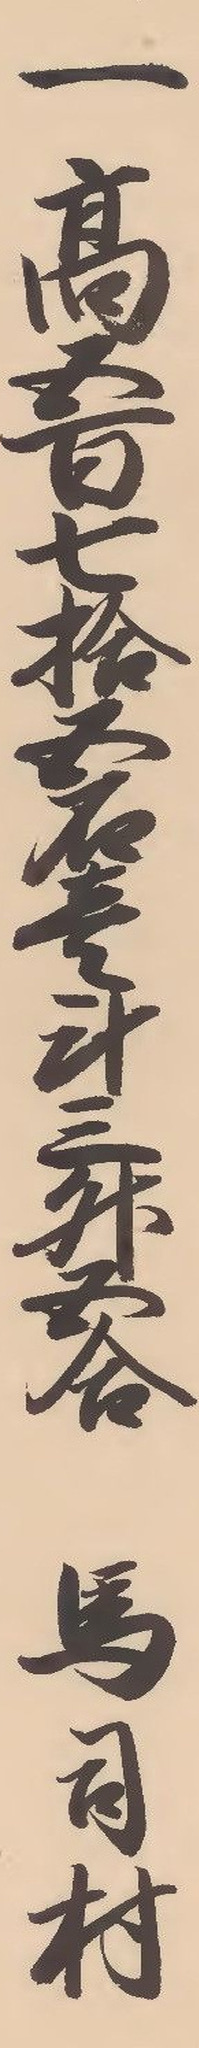一高五百七拾五石壱斗三升五合馬司村
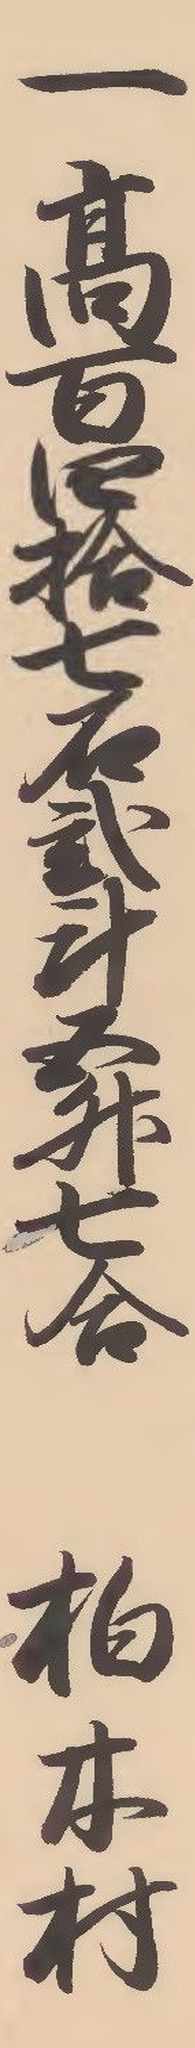一高百四拾七石弐斗五升七合柏木村
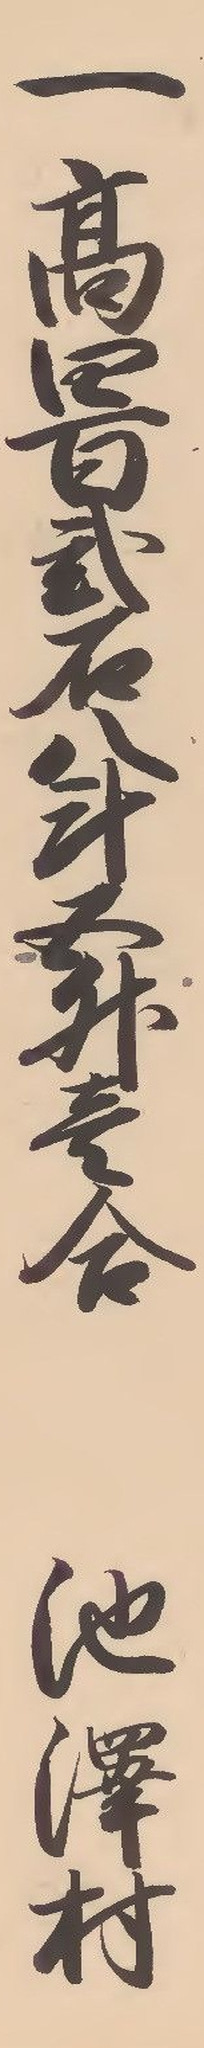一高四百弐石八斗五升壱合池沢村

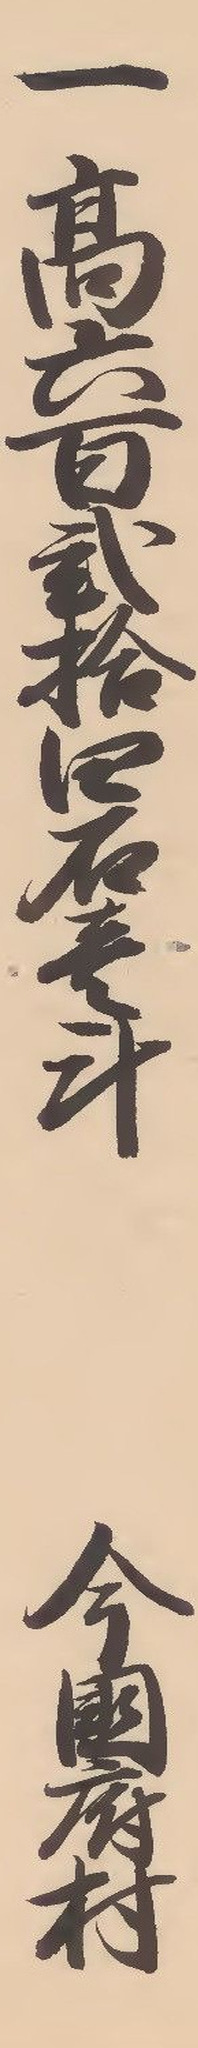一高六百弐拾四石壱斗今国府村
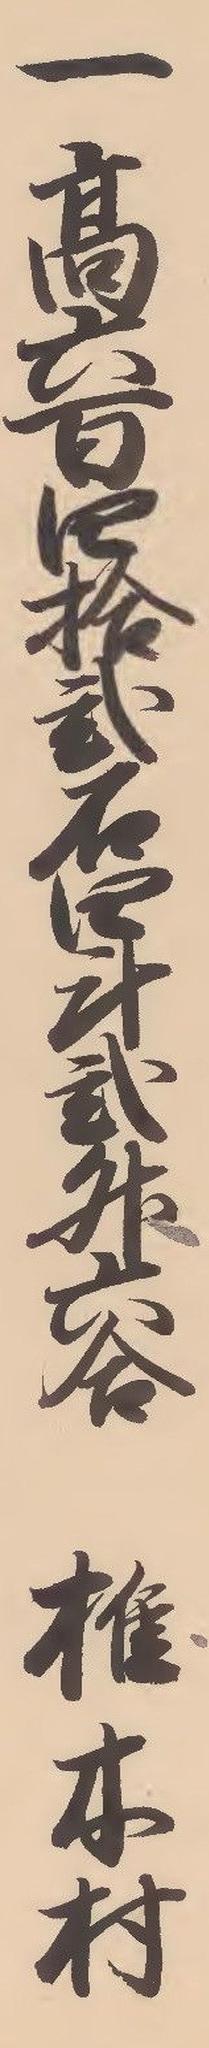一高六百四拾弐石四斗弐升六合椎木村
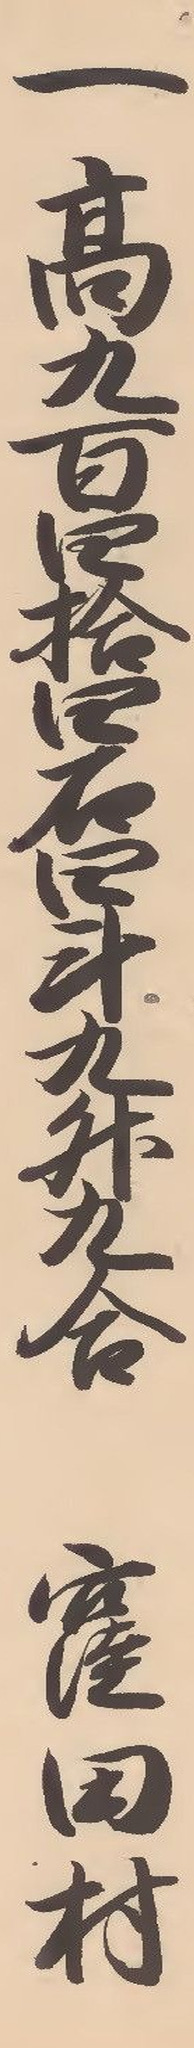一高九百四拾四石四斗九升九合窪田村
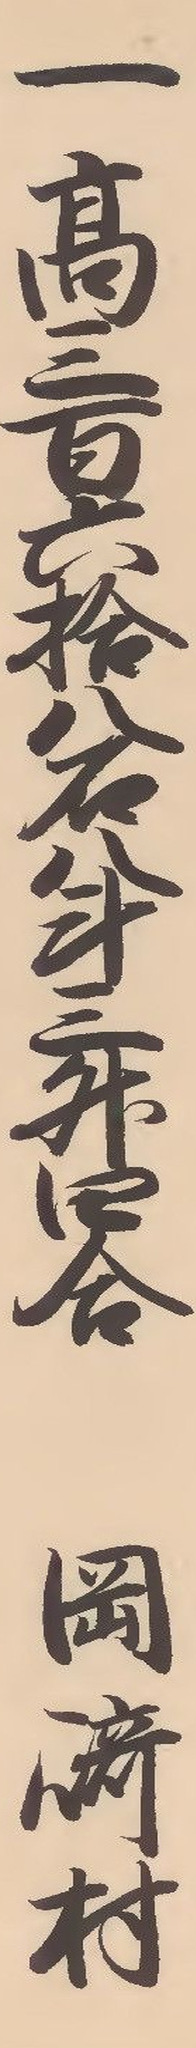一高三百六拾八石八斗三升四合岡崎村
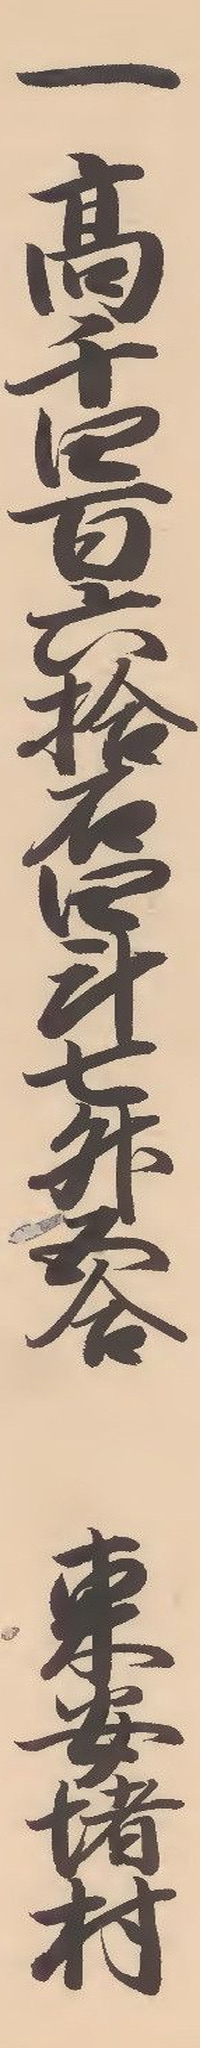一高千四百六拾石四斗七升五合東安堵村
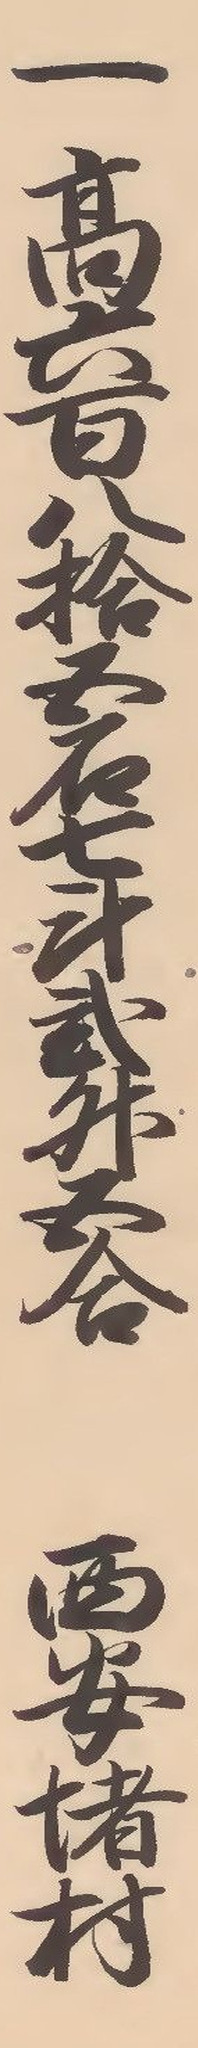一高六百八拾五石七斗弐升五合西安堵村

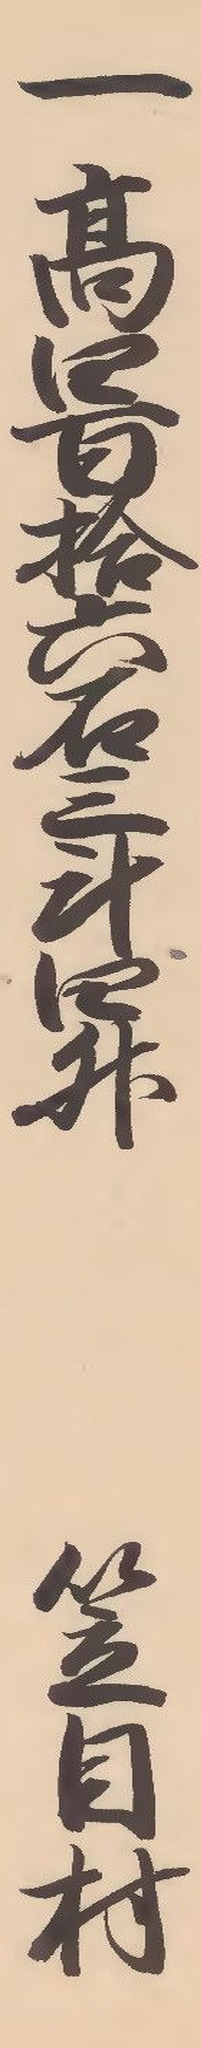一高四百拾六石三斗四升笠目村
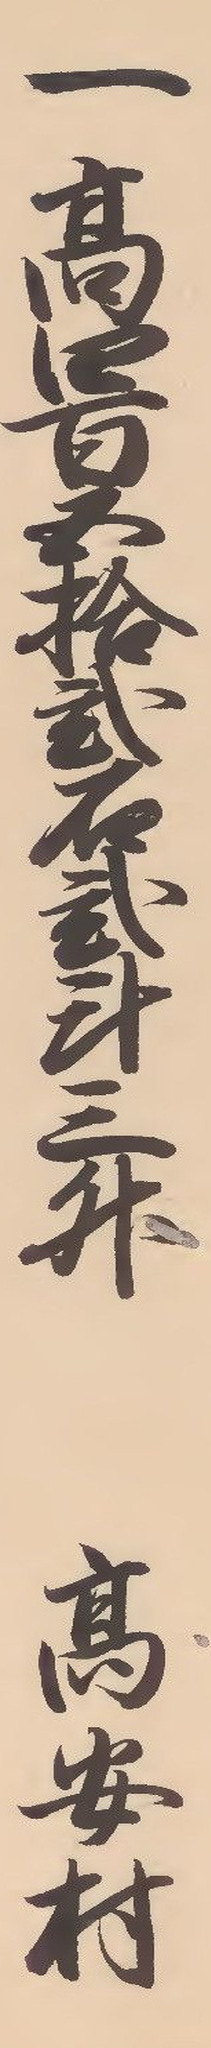一高四百五拾弐石弐斗三升高安村
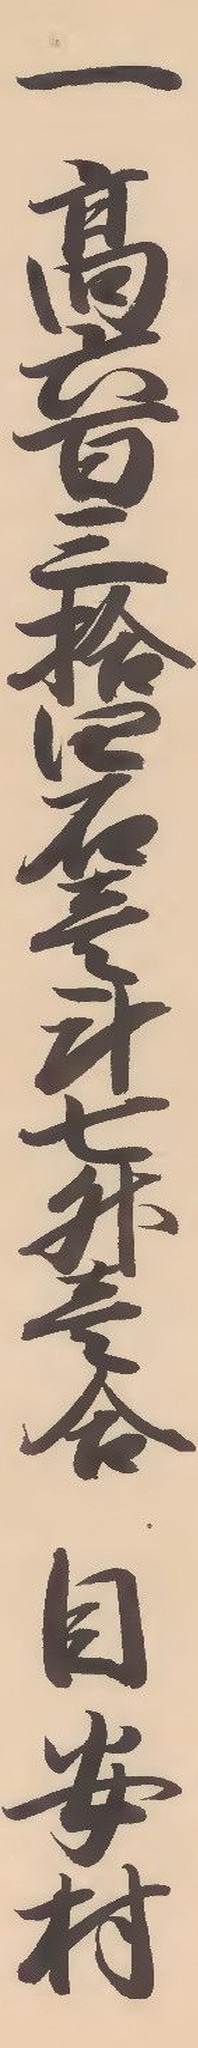一高六百三拾四石壱斗七升壱合目安村
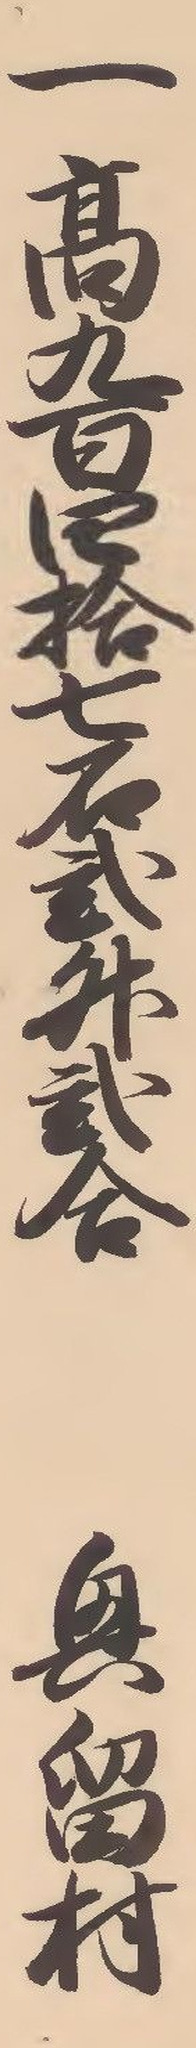一高九百四拾七石弐升弐合興留村
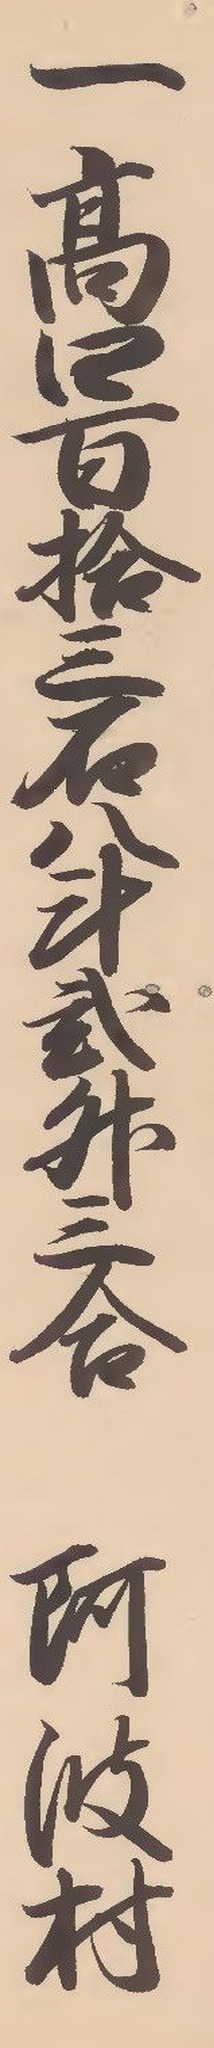一高四百拾三石八斗弐升三合阿波村
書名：大和国郷帳
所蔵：国立公文書館 National Archives of Japan
